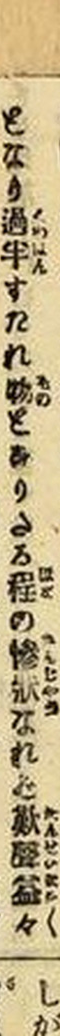となり過半すたれ物となりたる程の惨状なれば歎聲益々
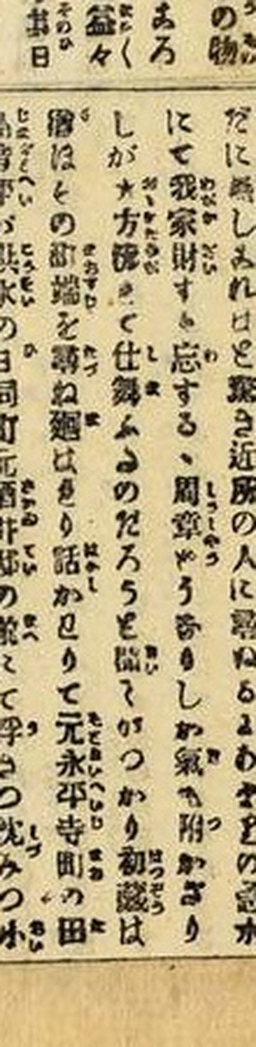しが大方流れて仕舞ふたのだろうと聞てがつかり初藏は
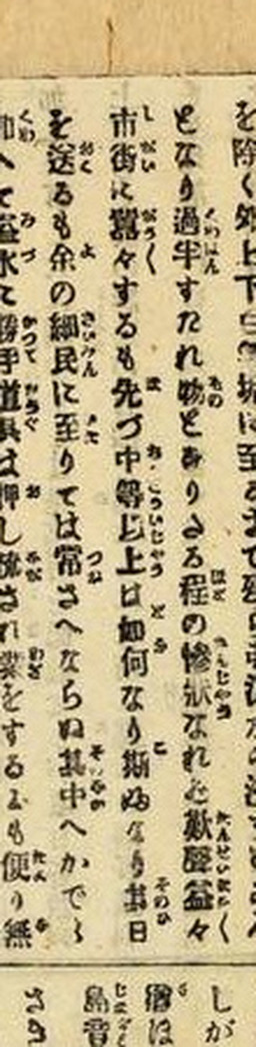市街に囂々するも先づ中等以上は如何なり斯ふなり其日
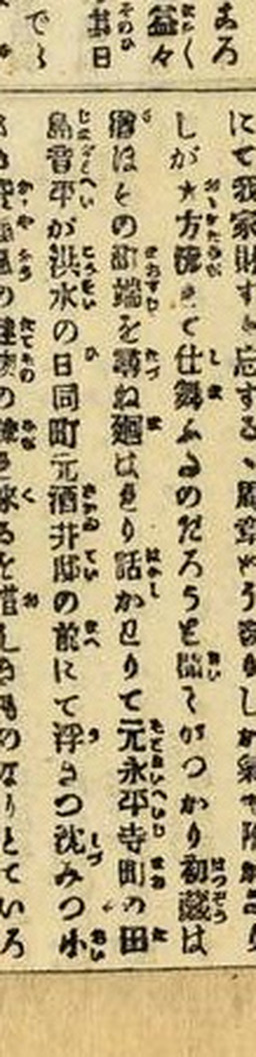猶ほその町端を尋ね廻はれり話かわりて元永平寺町の田
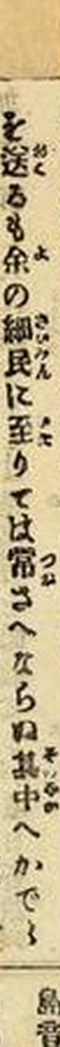を送るも余の細民に至りては常さへならぬ其中へかてゝ
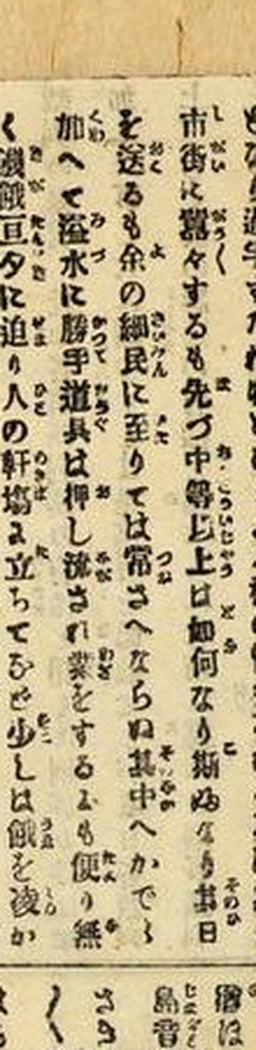を送るも余の細民に至りては常さへならぬ其中へかてゝ
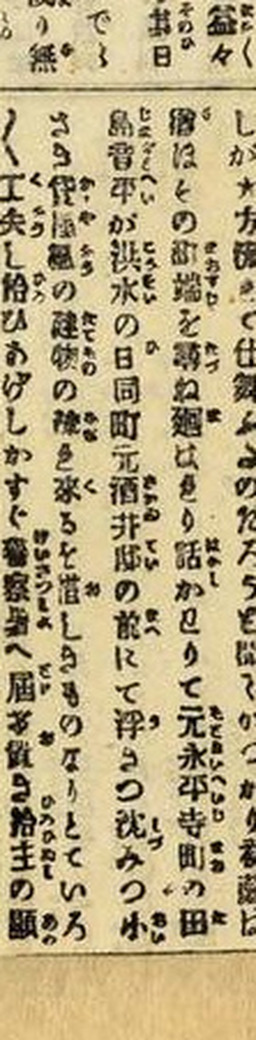島音平が洪水の日同町元酒井邸の前にて浮きつ沈みつ小
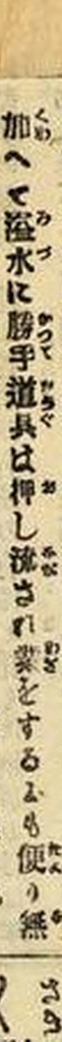加へて溢水に勝手道具は押し流され業をするにも便り無
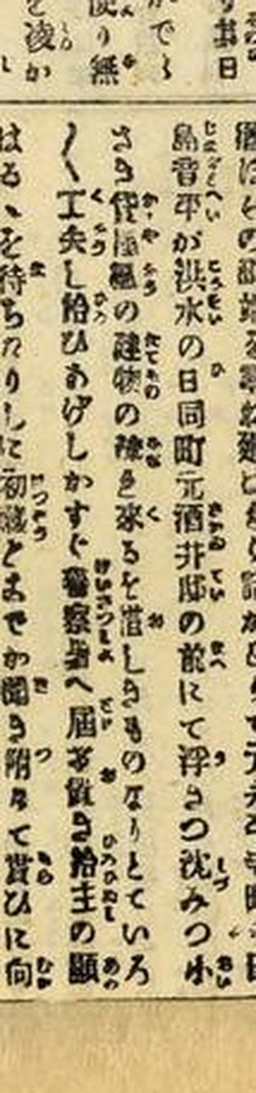さき貸家風の建物の流れ來るを惜しきものなりとていろ
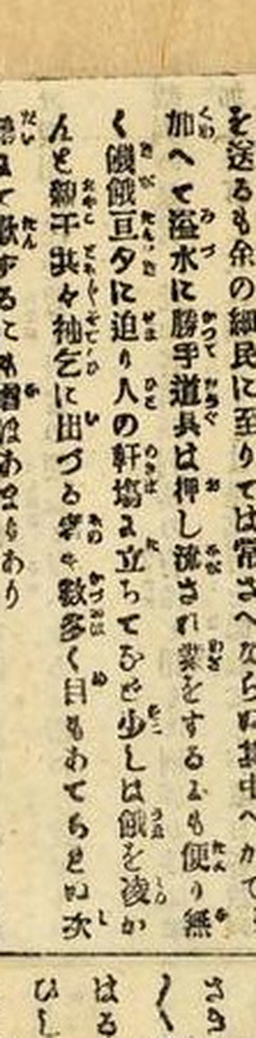く饑餓亘夕に迫り人の軒塲に立ちてなと少しは餓を凌か
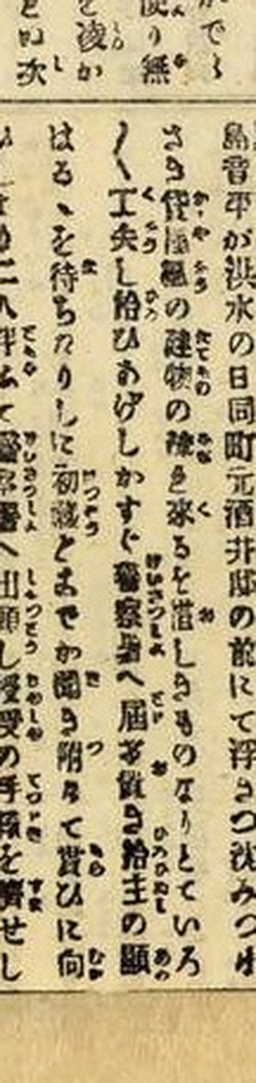〳〵工夫し拾ひあげしかすぐ警察署へ届け置き拾主の顯
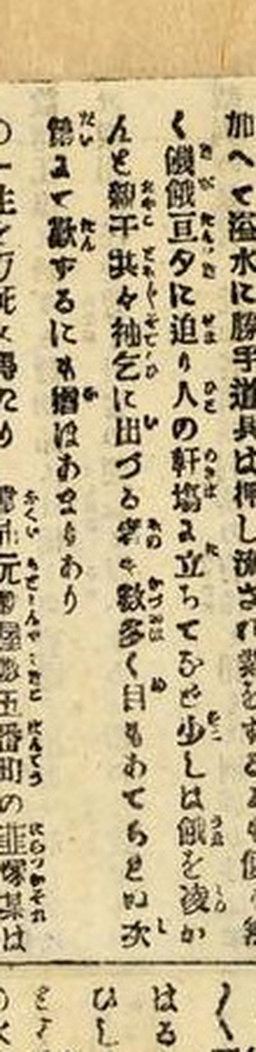んと親子共々袖乞に出づる者も數多く目もあてられぬ次
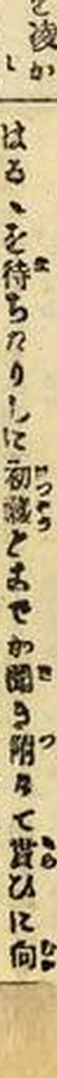はるゝを待ちたりしに初藏とこでか聞き附けて貰ひに向
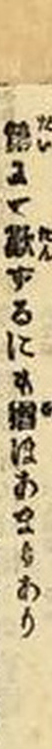第にて歎ずるにも猶ほあまりあり
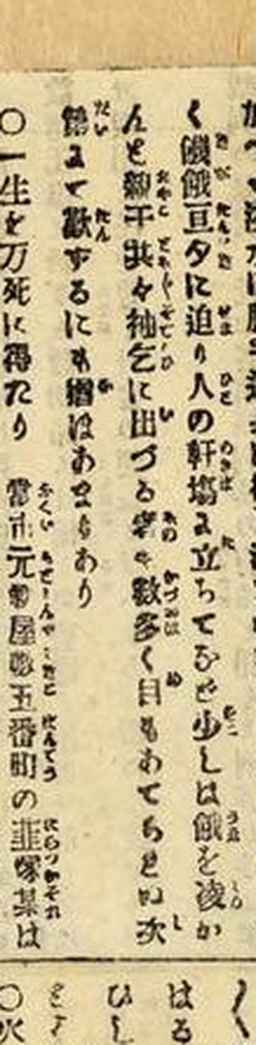んと親子共々袖乞に出づる者も數多く目もあてられぬ次
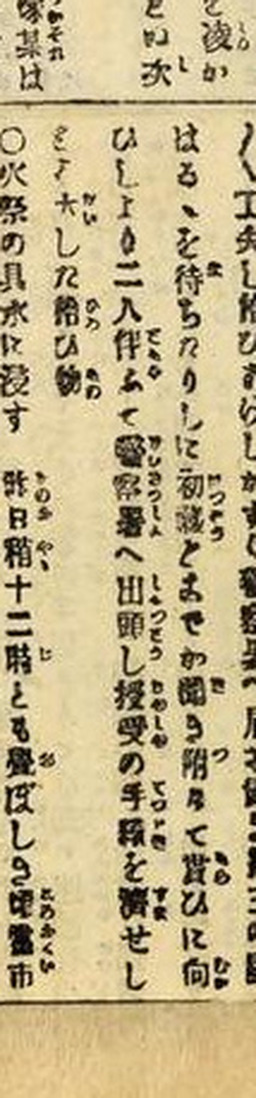ひしより二人伴ふて警察署へ出頭し授受の手續を濟せし
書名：温古集 五巻
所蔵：福井県文書館 Fukui Prefectural Archives
